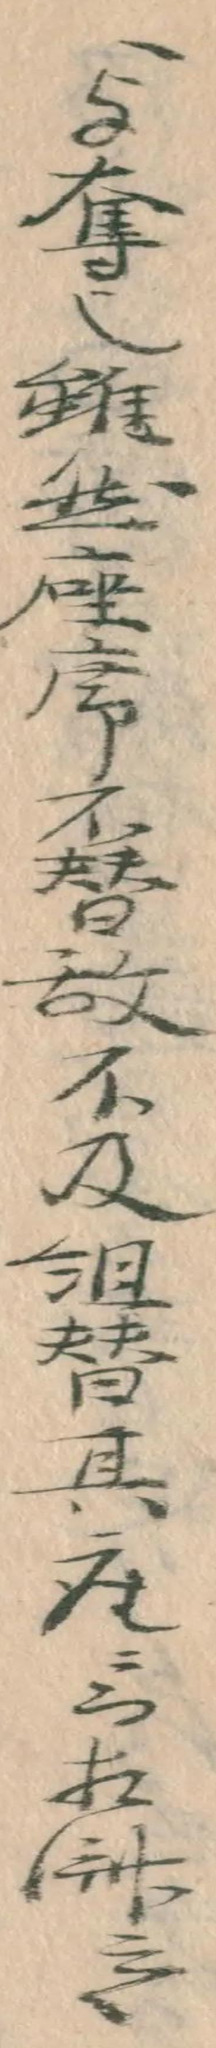へ与奪也雖然座席不替故不及組替其座ニ而相済云々
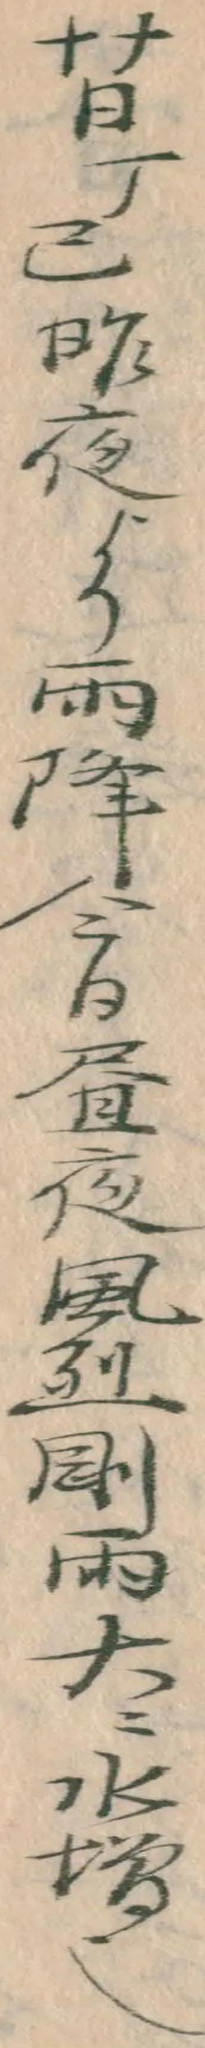廿日丁巳昨夜より雨降今日昼夜風烈剛雨大ニ水増也
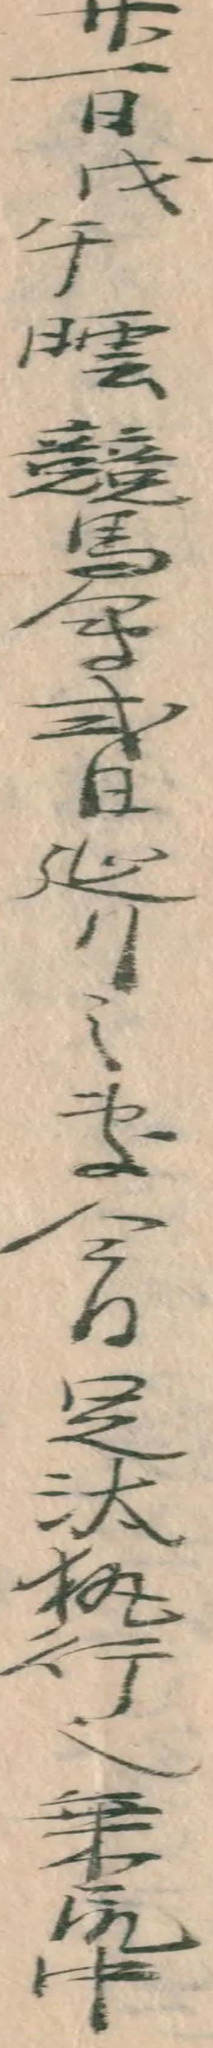廿一日戊午曇競馬会式日延引之処今日足汰執行也乗尻中
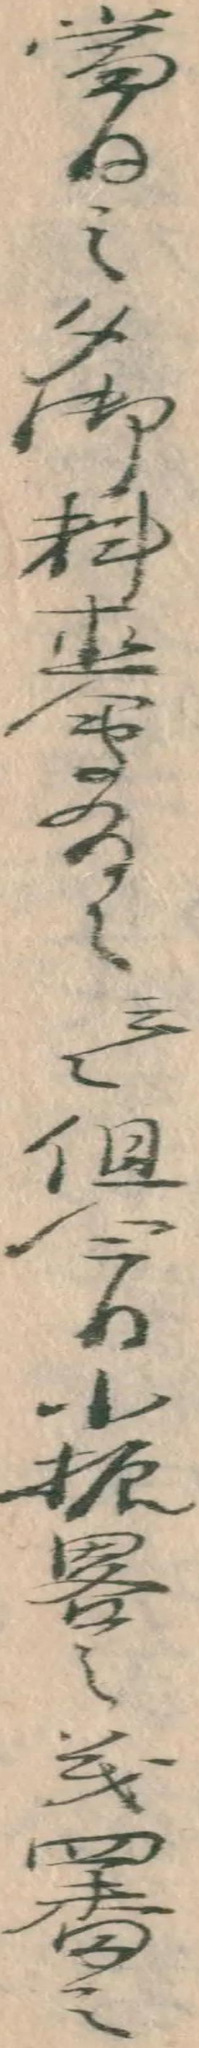当日之夕御料直会有之云々但今日小振略之義四番之
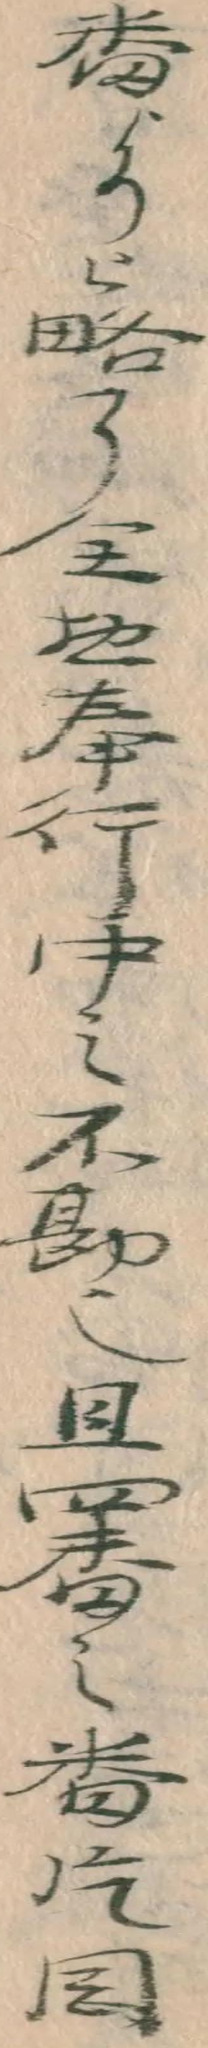番より被略了全惣奉行中之不勘也且四番之番片岡
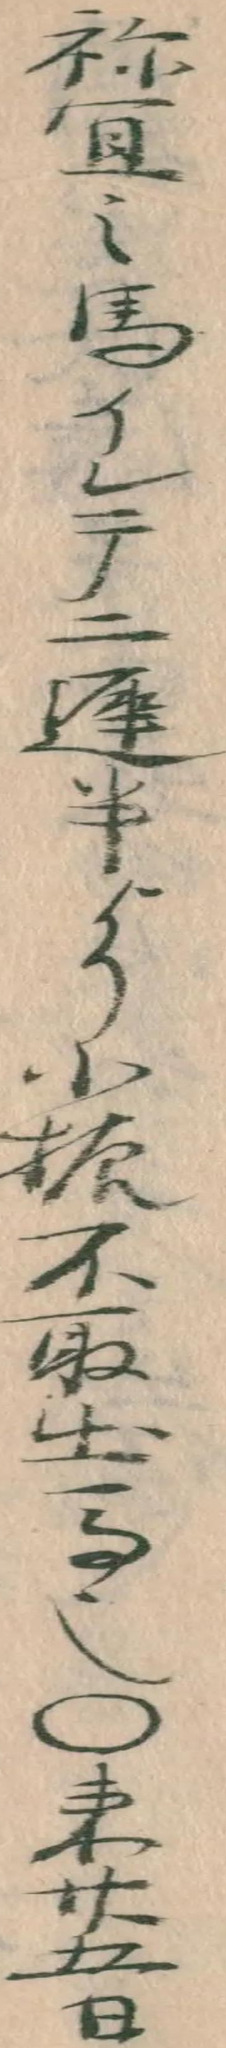祢宜之馬イレテ二遅半より小振不取出馬也○来廿五日
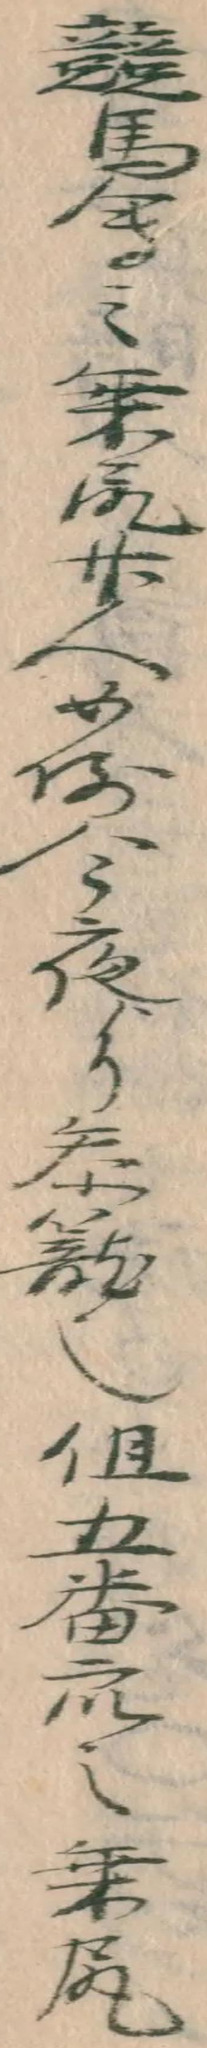競馬会之乗尻廿人如例今夜より参籠也但五番衆之乗尻
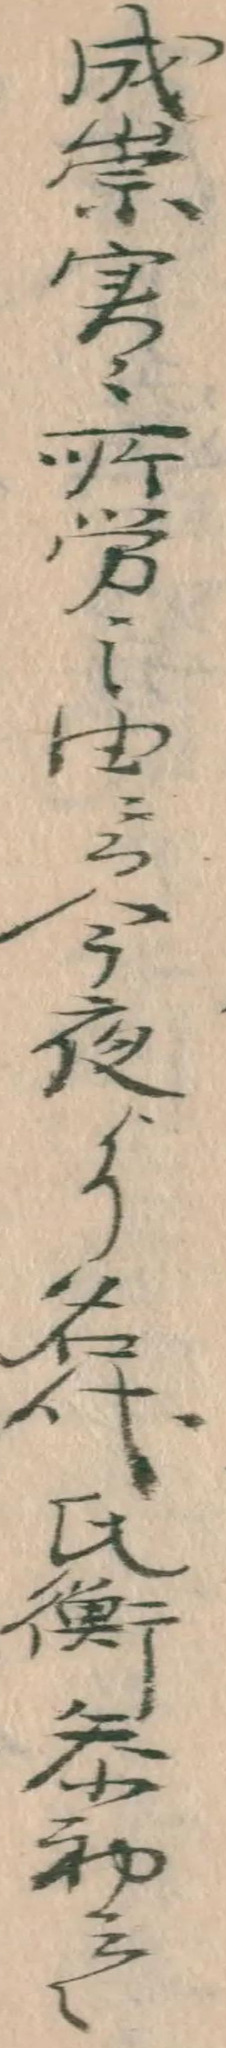成崇実ニ所労之由ニ而今夜より名代氏衡参勤云々
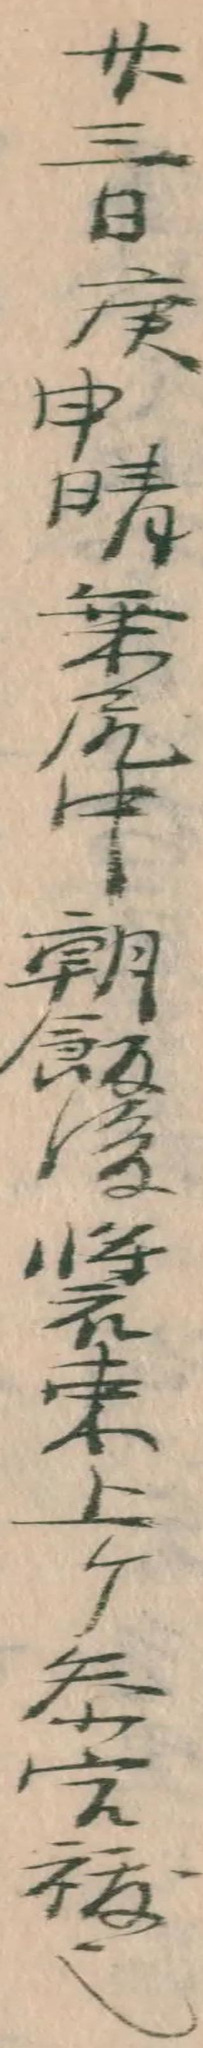廿三日庚申晴乗尻中朝飯後装束上ケ参宮祓也
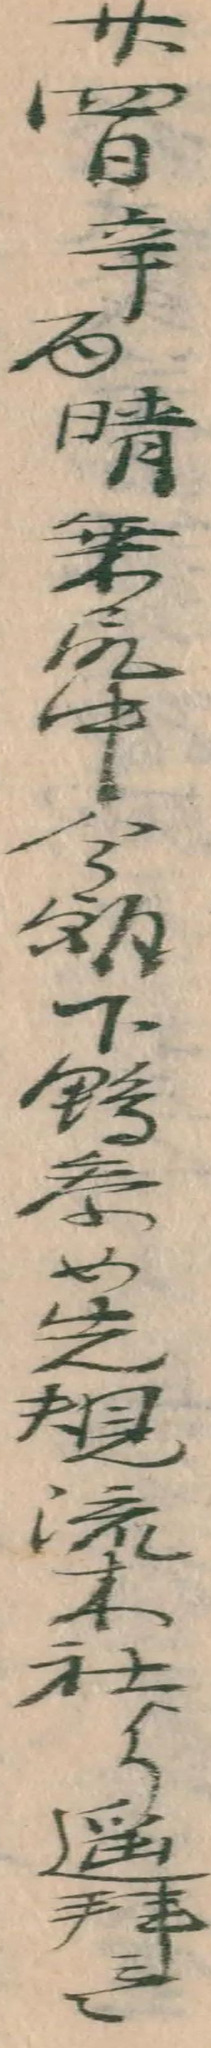廿四日辛酉晴乗尻中今朝下鴨参如先規流木社より遥拝云々
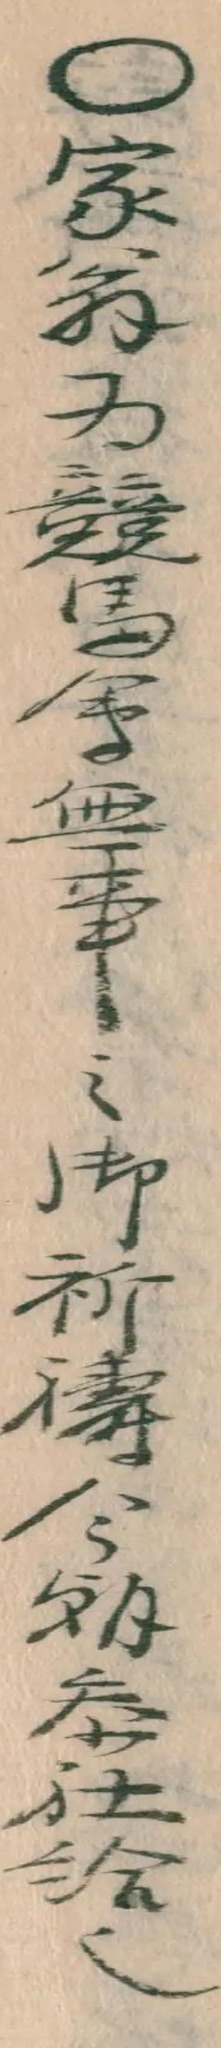○家翁為競馬会無事之御祈祷今朝参社給也
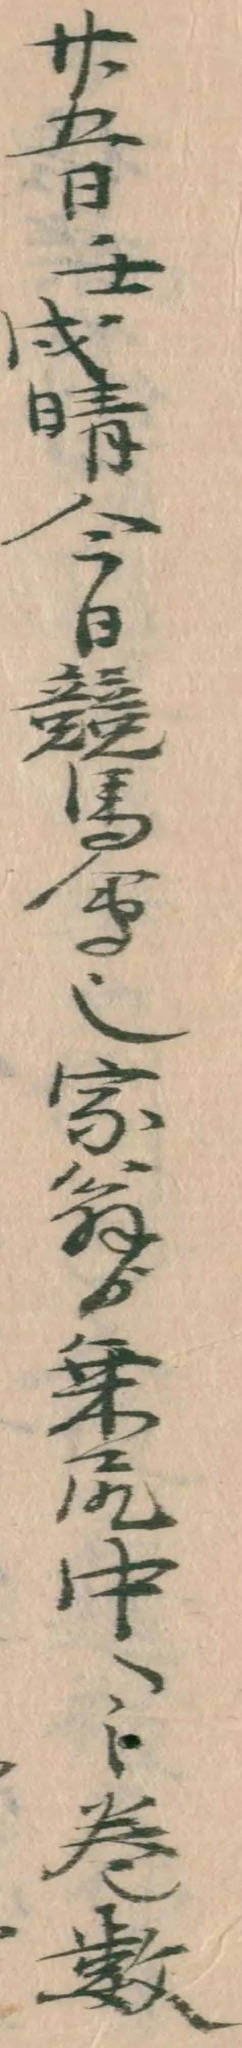廿五日壬戌晴今日競馬会也家翁ゟ乗尻中へ之巻数
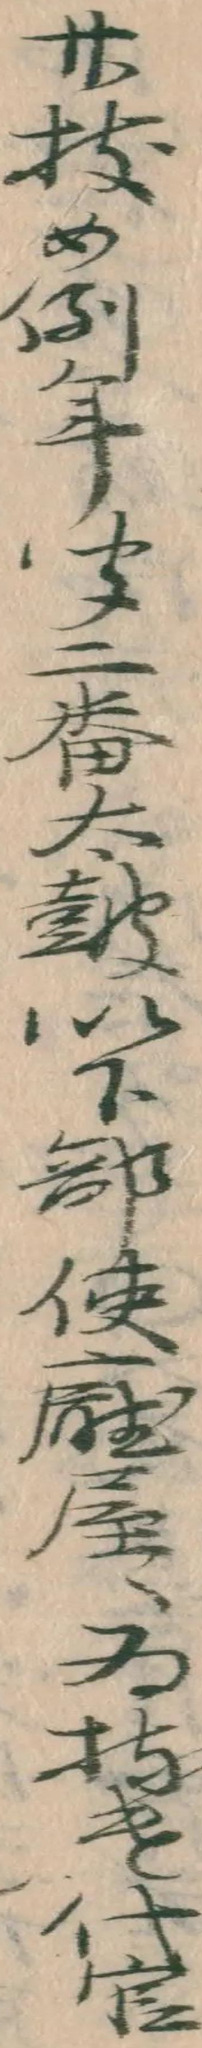廿枝如例年聞二番太鼓以下部使庁屋へ為持遣代官
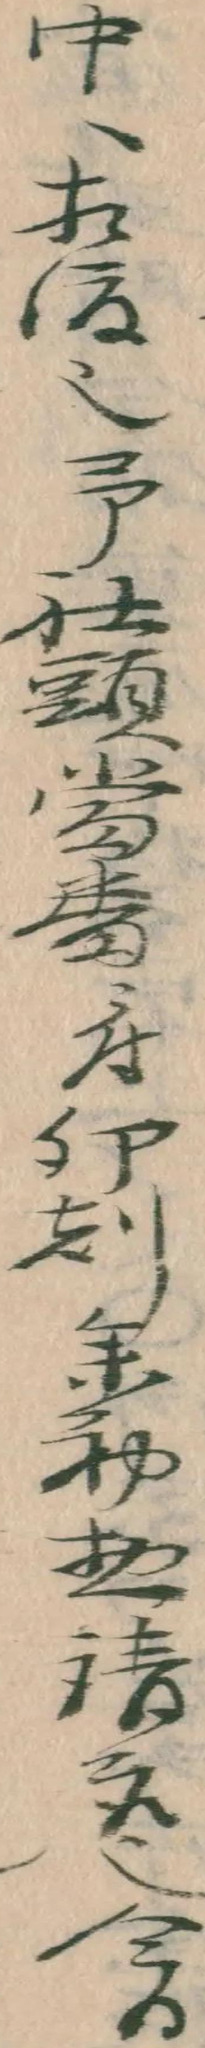中へ相渡也予社頭当番ニ付卯刻参勤惣請取也今日
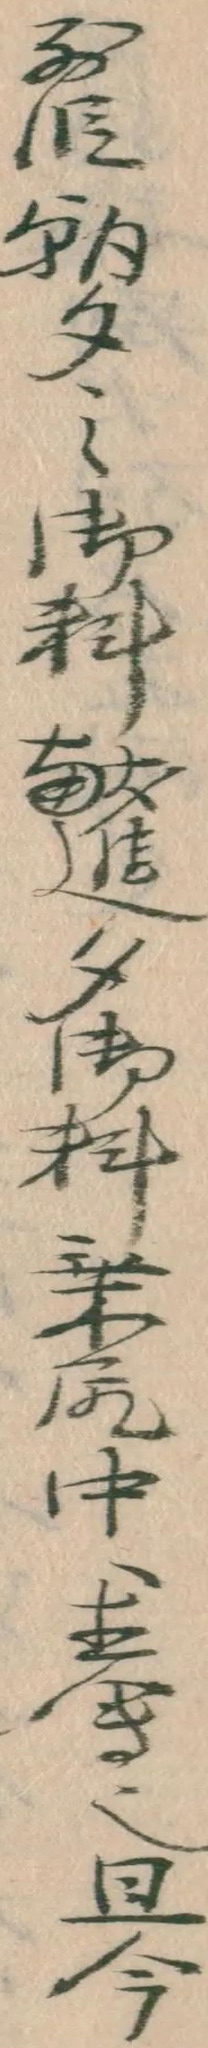別段朝夕之御料献進夕御料乗尻中へ直会也且今
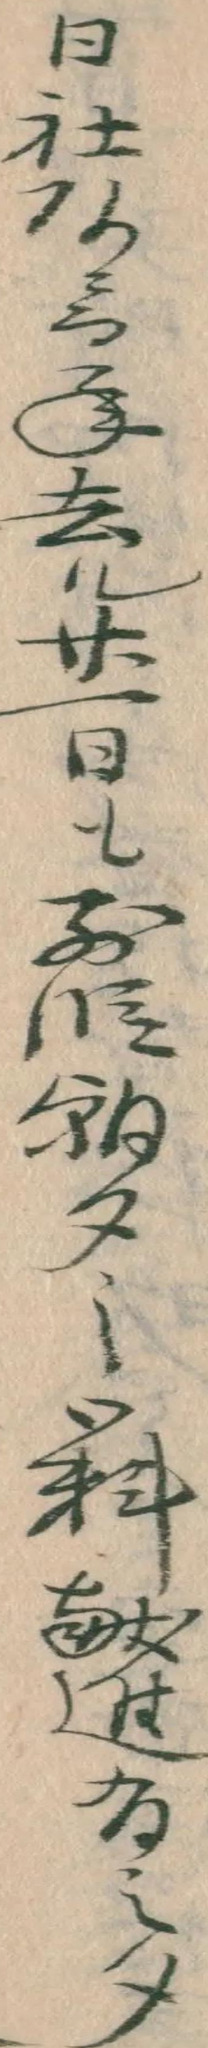日社頭ニ而承去ル廿一日も別段朝夕之御料献進有之夕
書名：賀茂社記録. 第64冊
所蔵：国立国会図書館 National Diet Library, JAPAN
